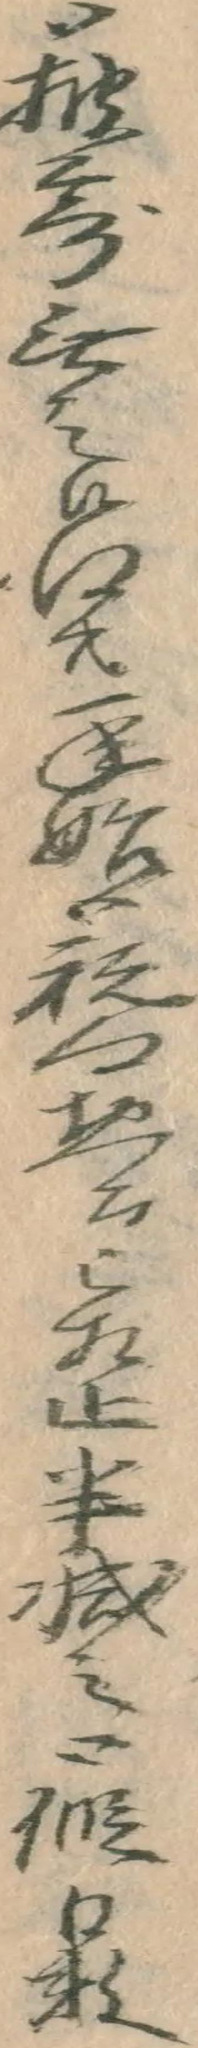御披露無之候得共承始御祝向惣而被相止半減之御仮日数

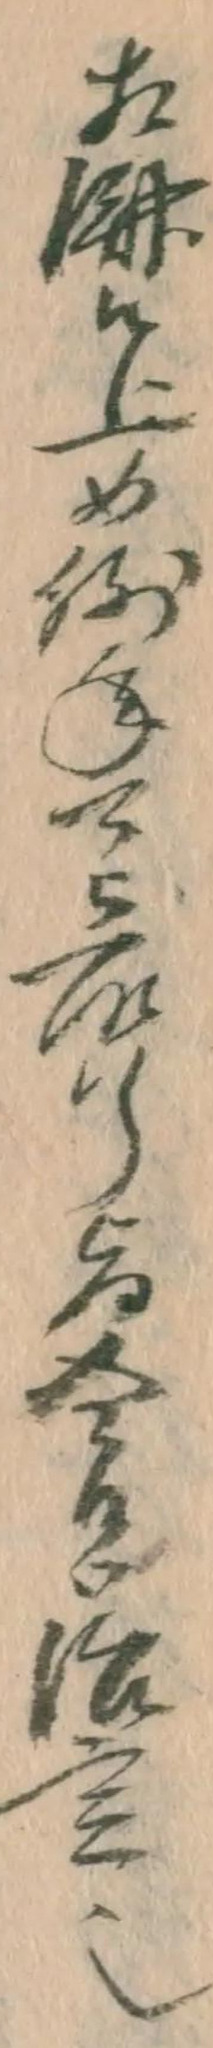相済候上如例年可被承行旨今日御治定也
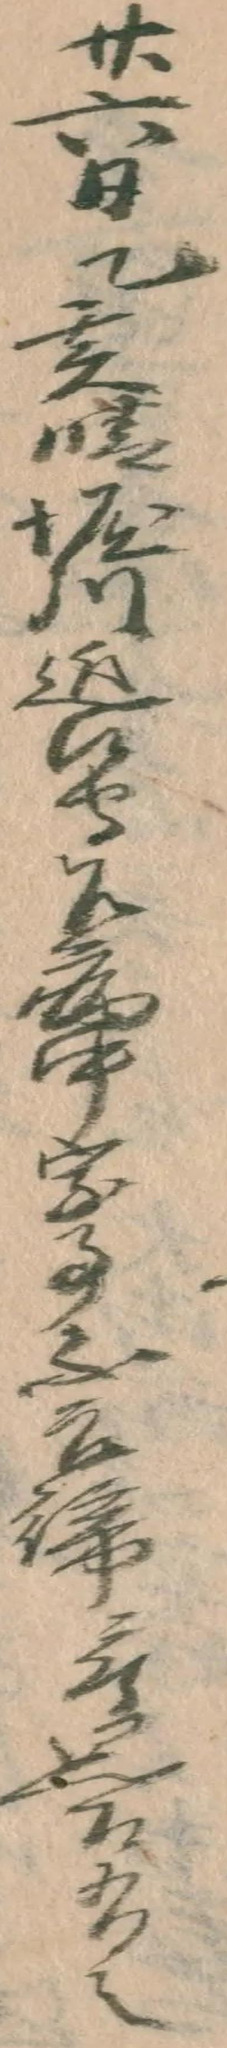廿六日乙亥晴堀川近江守乍病中家事不取締ニ付思召有之
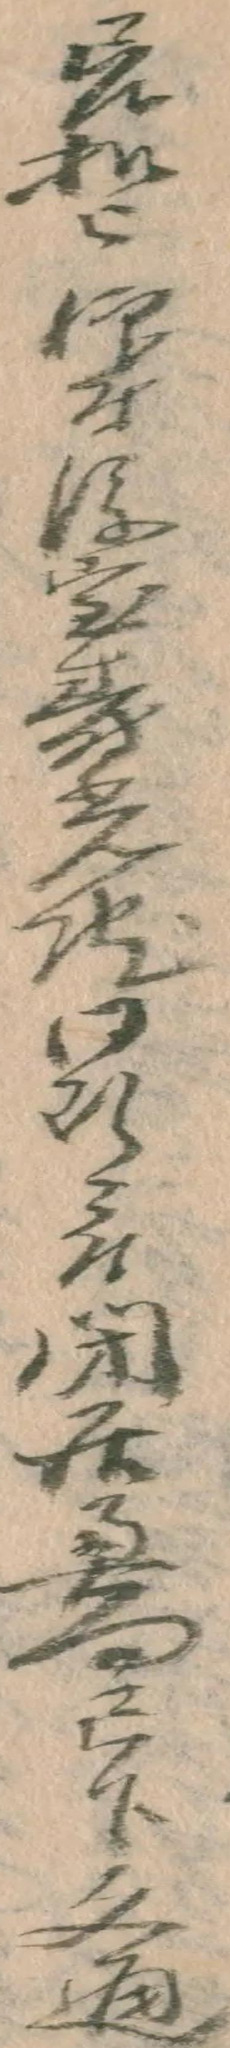差扣被仰付後宝寿光院同断二付閉居奥向已下各通
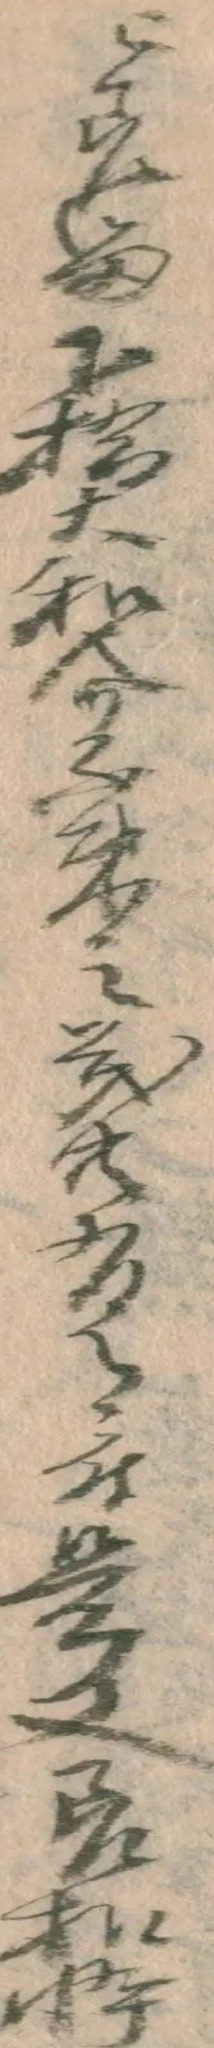被差留下橋大和介不来之義共有之ニ付是又差扣忰
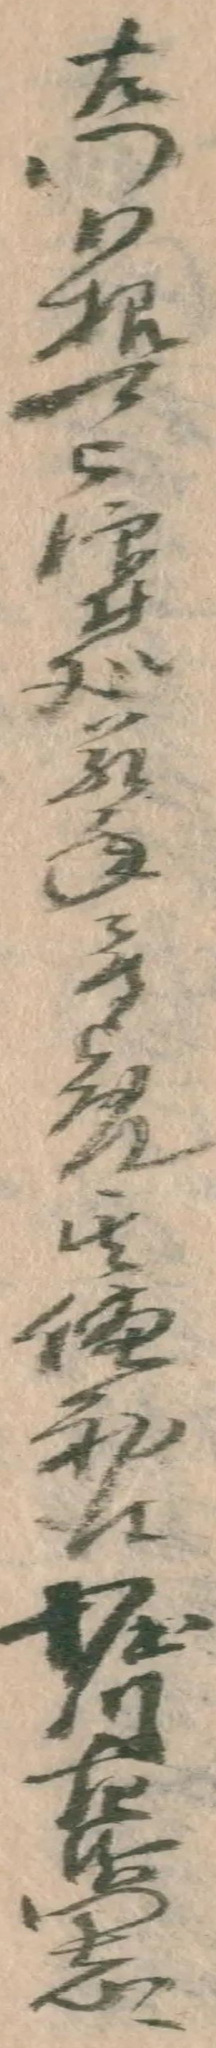左門口根可被仰付処若年ニ付被免其侭勤仕堀川左衛門志ヘ
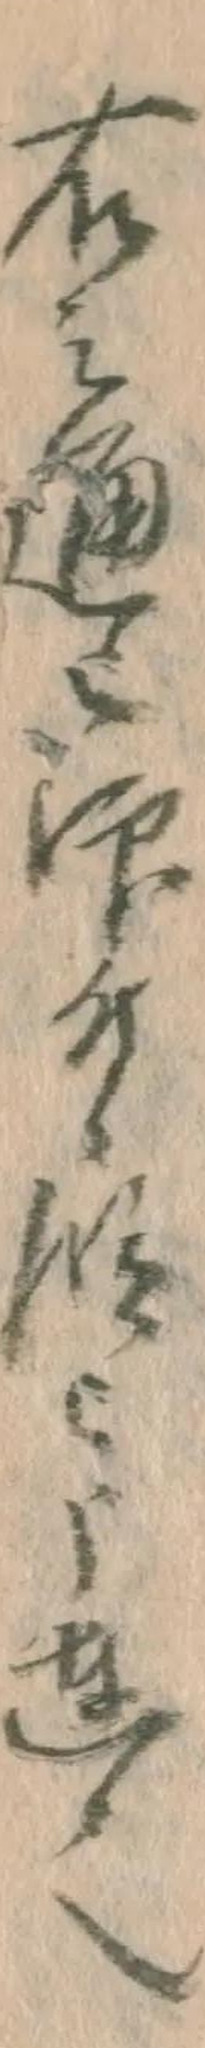右之通被仰付候段被申達也
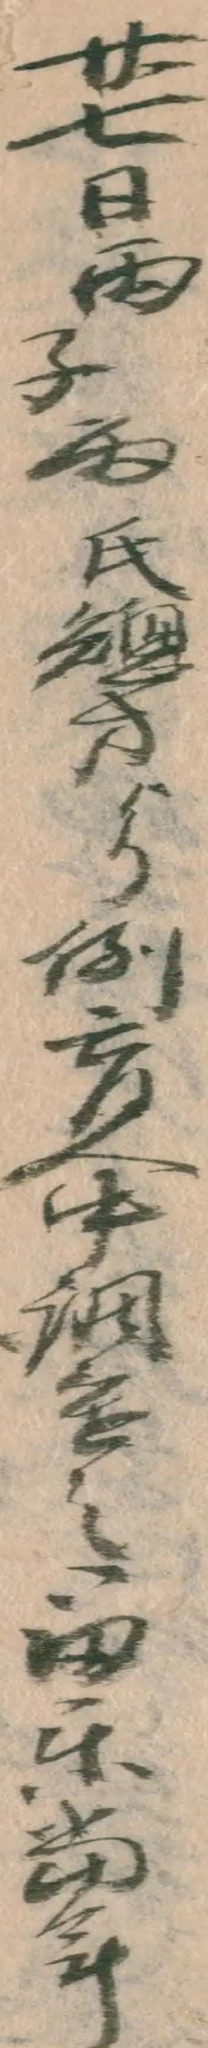廿七日丙子雨氏總方より例盲人中調進之御田楽當年
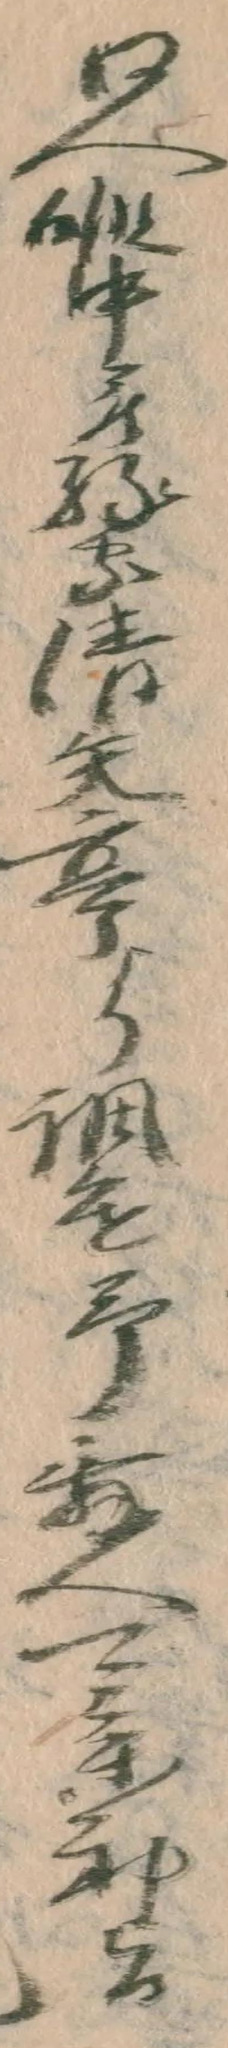同人暇中ニ付孫家清矢亭より調遣予舞人可参勤旨
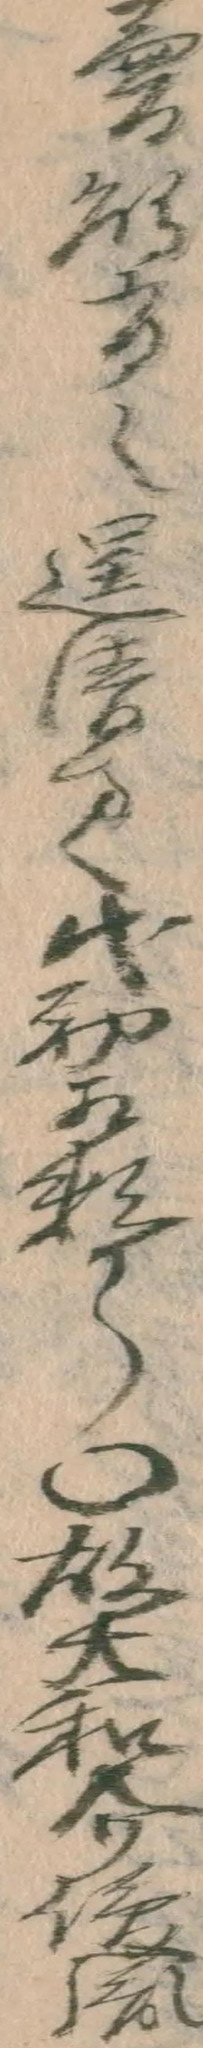兼而觸有之逞清方へ代勤相頼了○故大和介俊胤
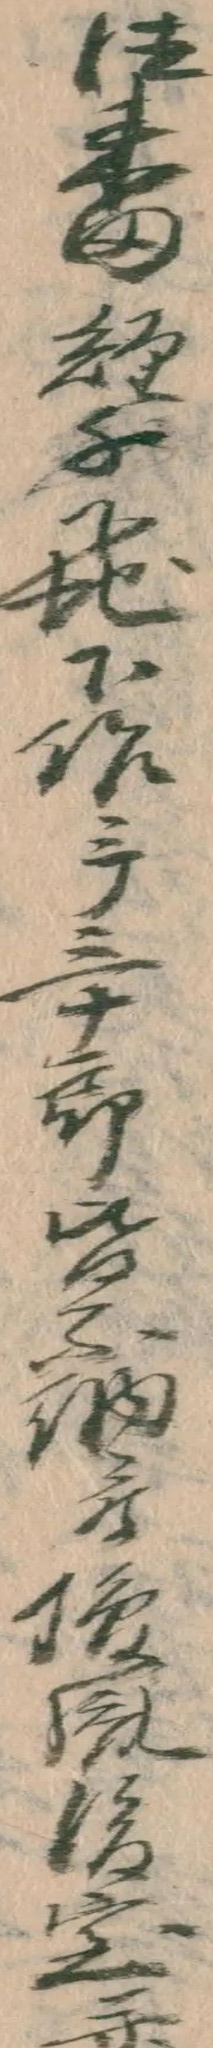往来田経千下地下作手三十郎皆不納ニ付俊胤後室并
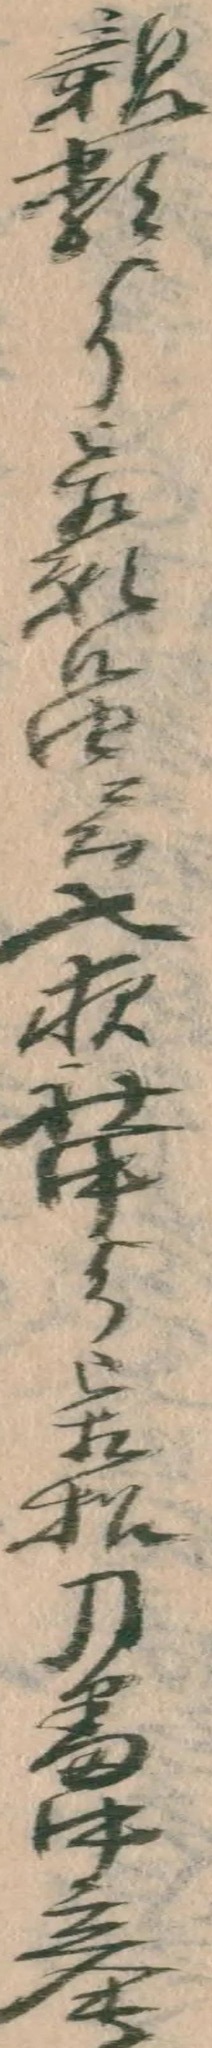親類より被相願候由二而入夜社中より被相招月番中立會
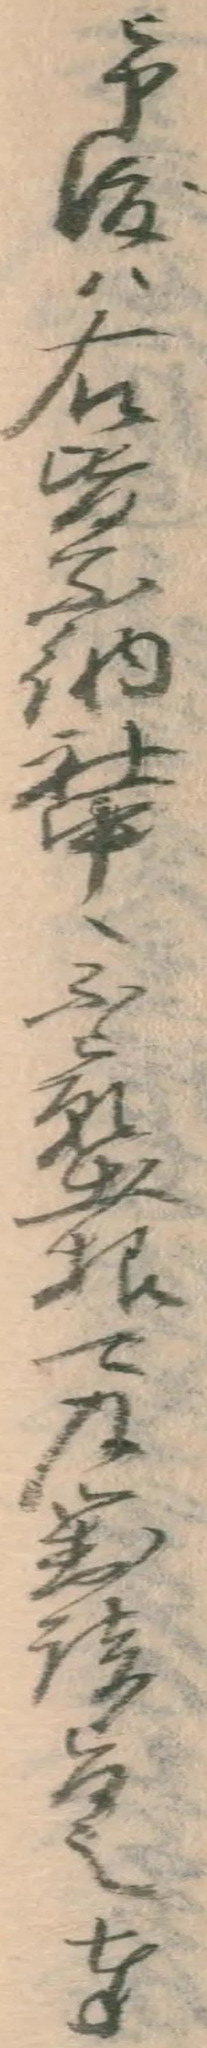被申渡ハ右皆不納社中へ不被願出様可及請旨之奉
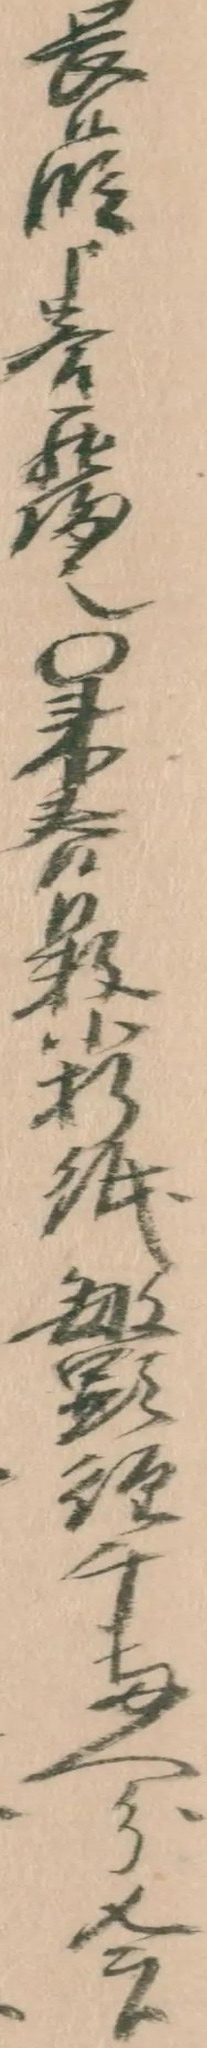畏候段申答罷帰也○来春日数小折紙敏顕経千両人分今日
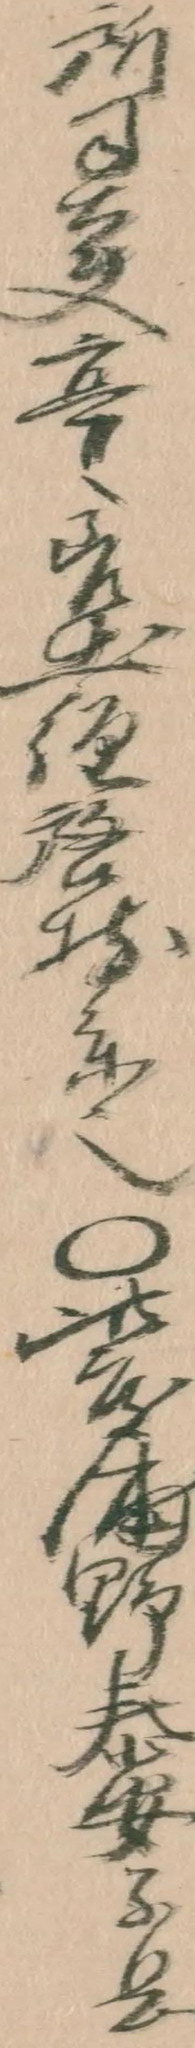所司大夫亭へ差出経啓持参之〇此度浦野泰安子息
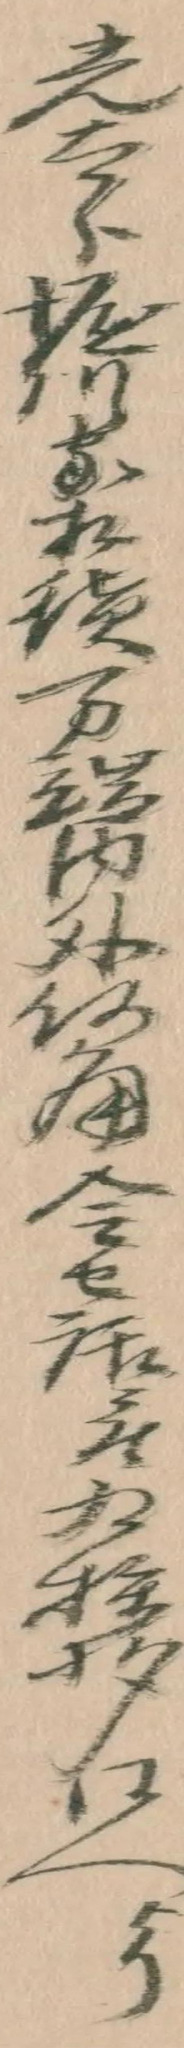光太郎堀川家相続万端内外何角令世話ニ付為挨拶同人より
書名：賀茂社記録. 第67冊
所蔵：国立国会図書館 National Diet Library, JAPAN
